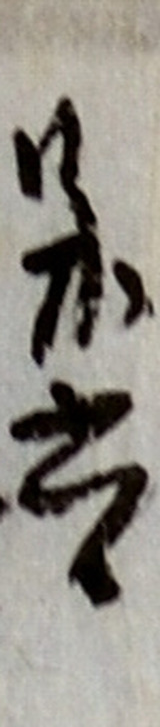同廿六日
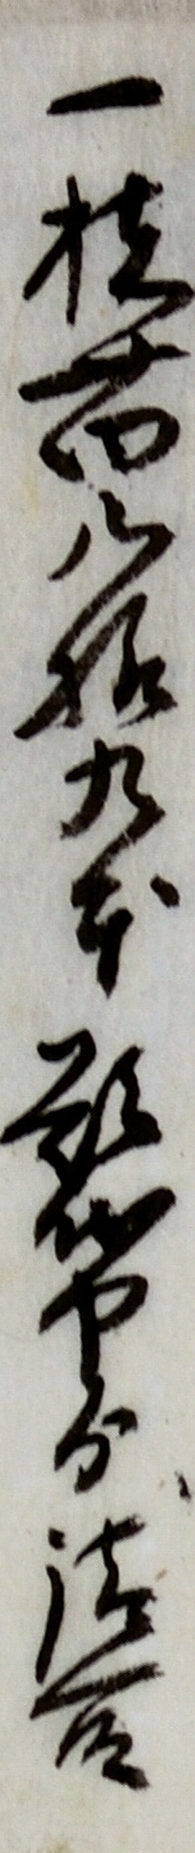一楮苗八拾九本郡代中より請取
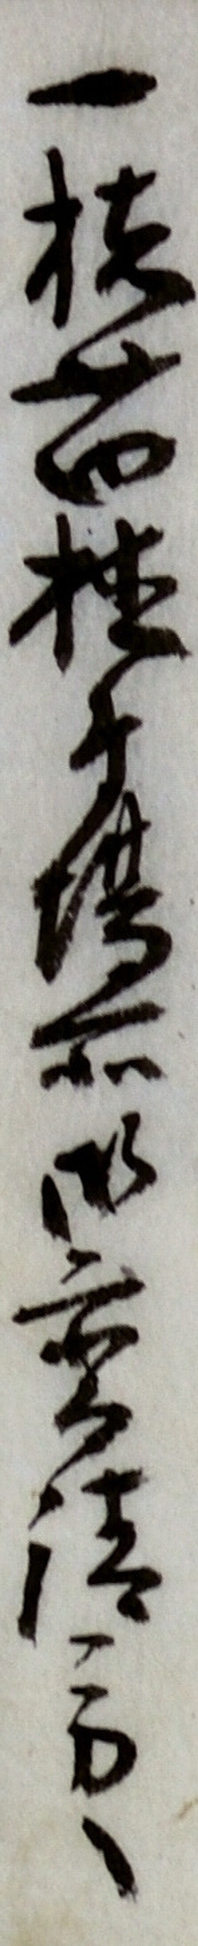一楮苗植付場所御普請方へ
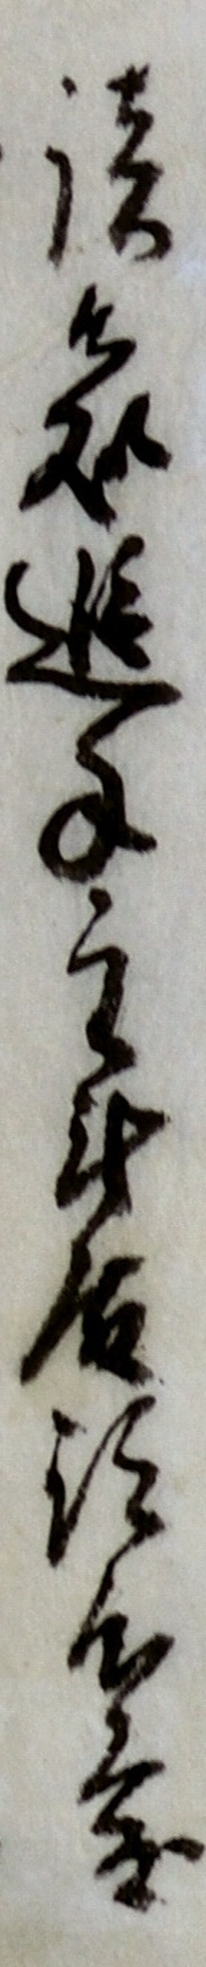談候処追手主計殿跡屋敷
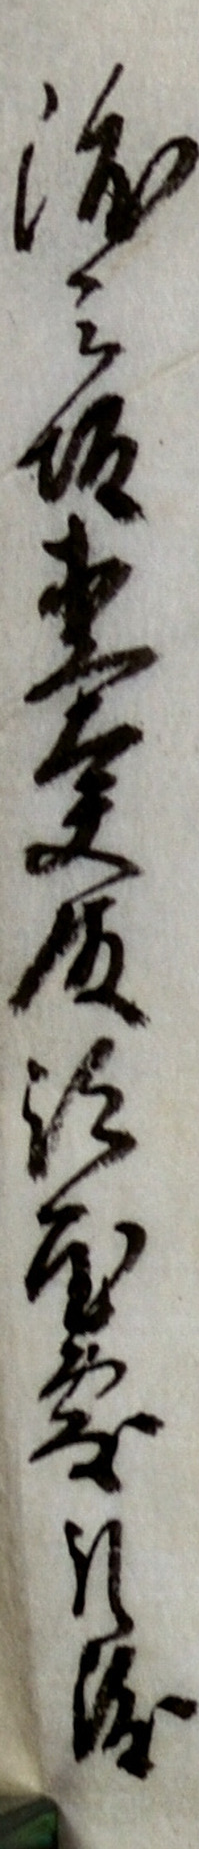渡之坂杢大夫殿跡屋敷引渡

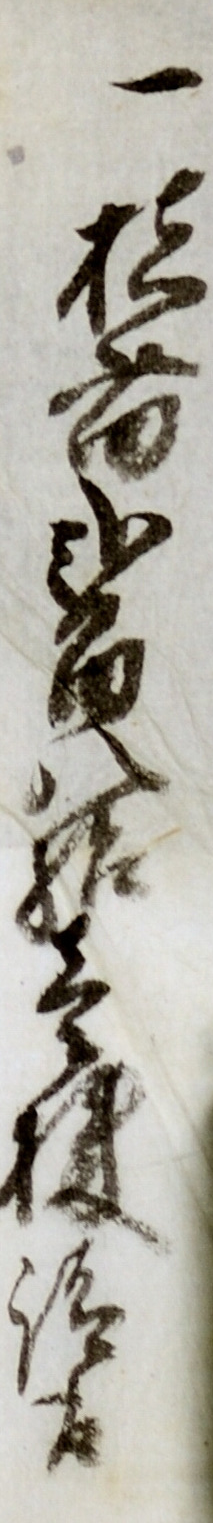一楮苗弐百八拾壱株請取
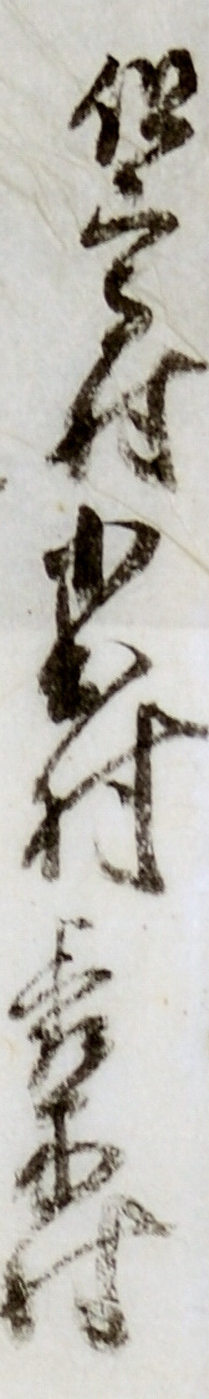但山寺村小出村表木村
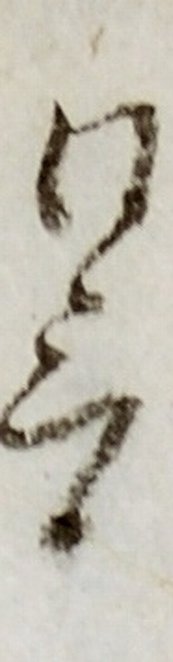同三日
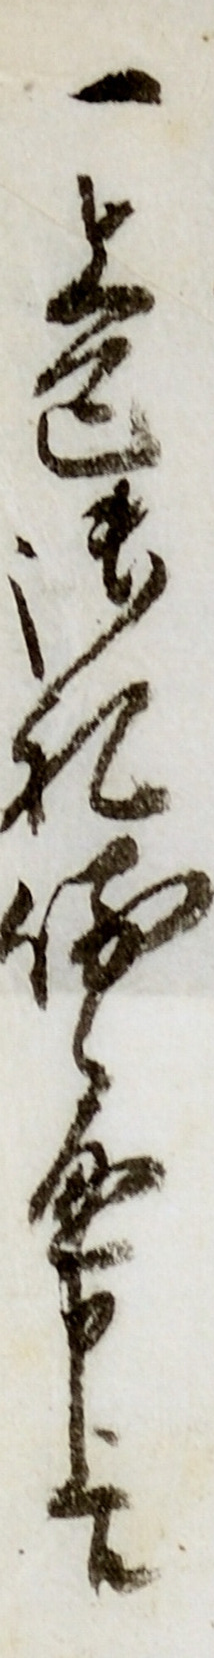一上巳御礼例之通申上候
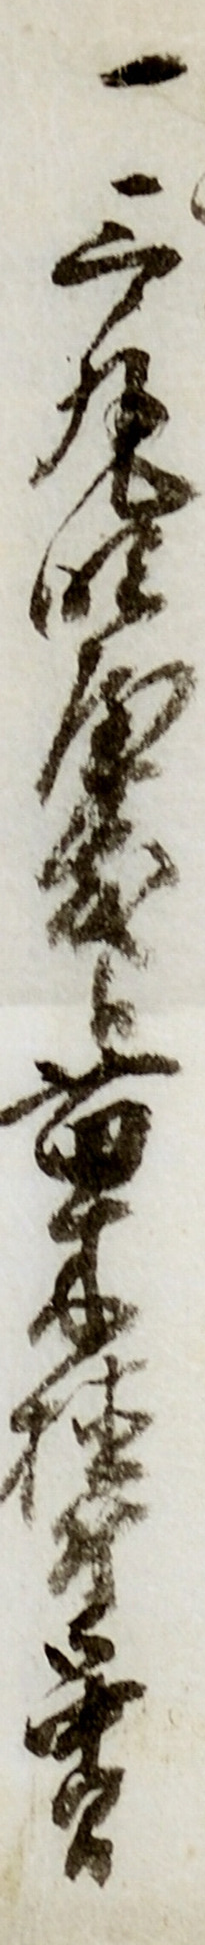一三ノ丸明屋敷え苗木植付御中間
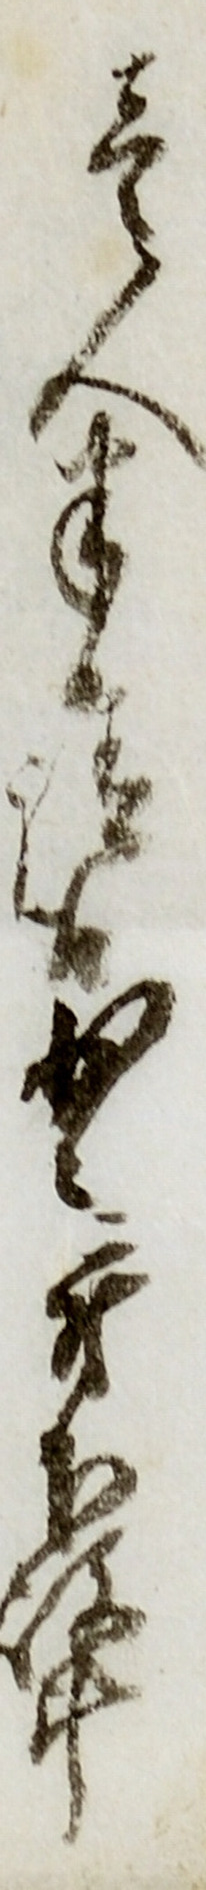壱人半日請取少々に付下役計
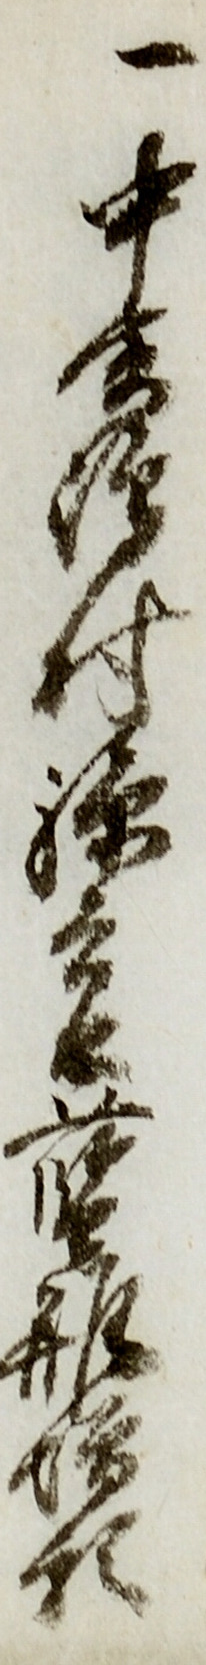一中殿嶋村孫兵衛藍瓶増願
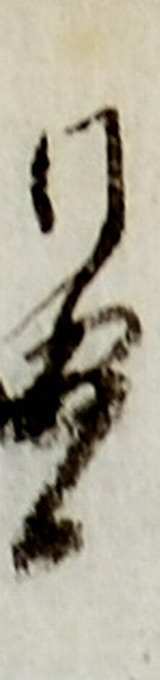同五日
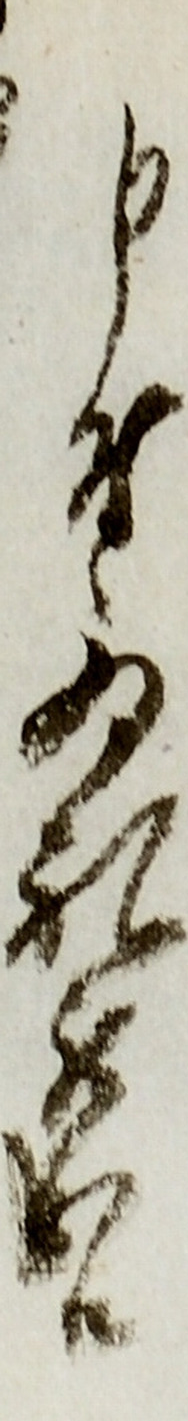申付為礼罷出候
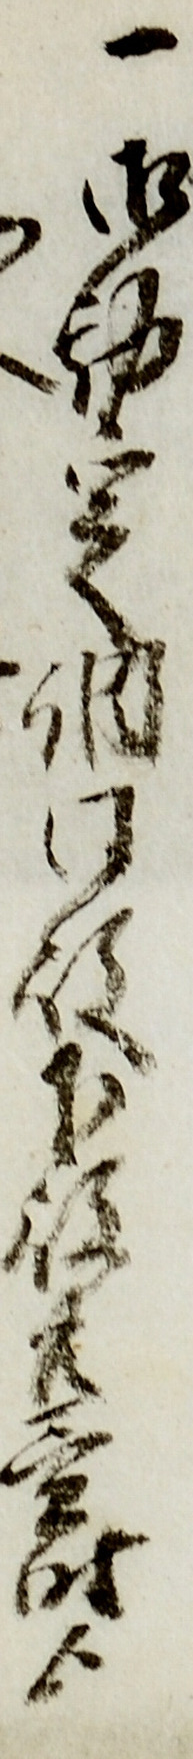一御勘定調同役下役共昼時より
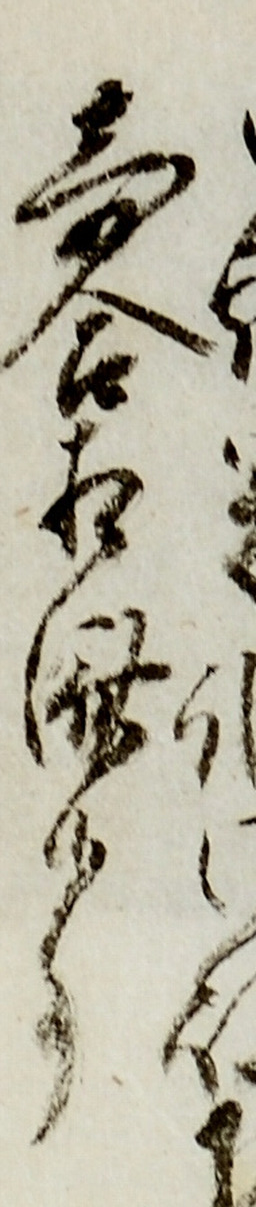寄合相済候事
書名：諸事御用留帳
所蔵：伊那市立高遠町図書館・合同会社AMANE
